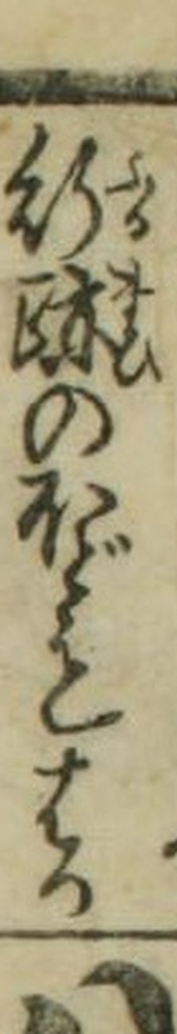行跡のほどをはか
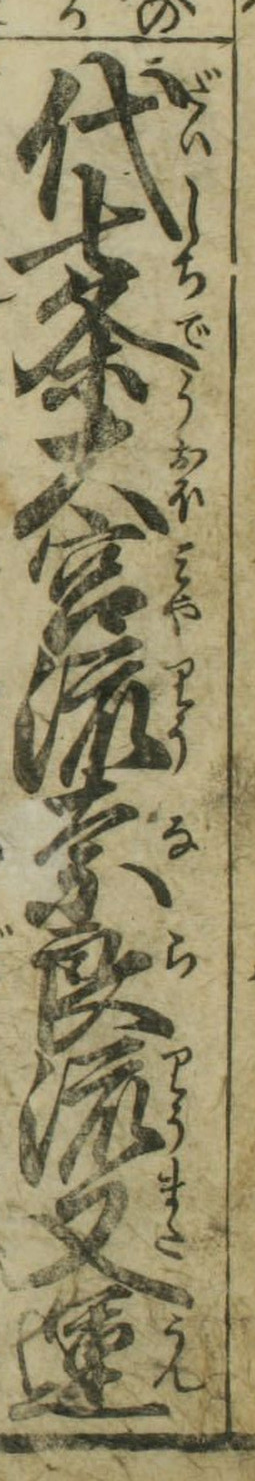代七条大宮流奈良流又運
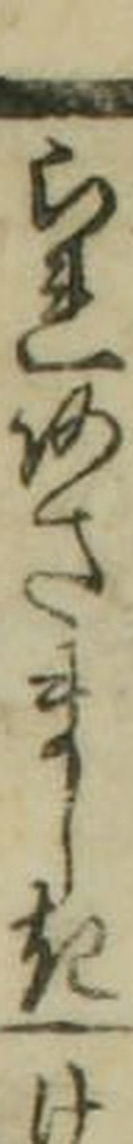られあさましき
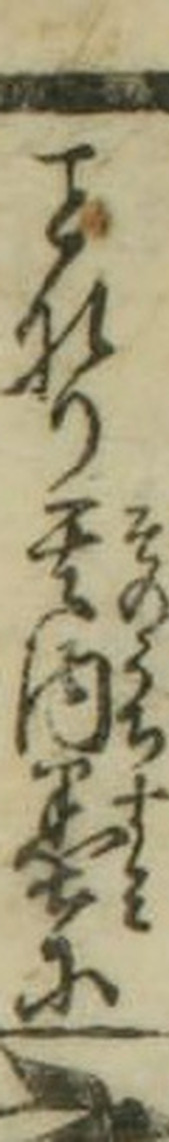ことなり其内墨に
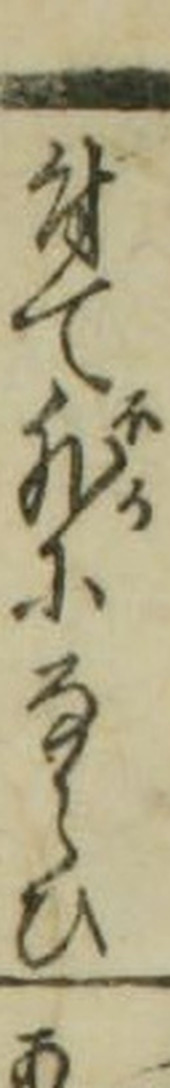付て外にならひ
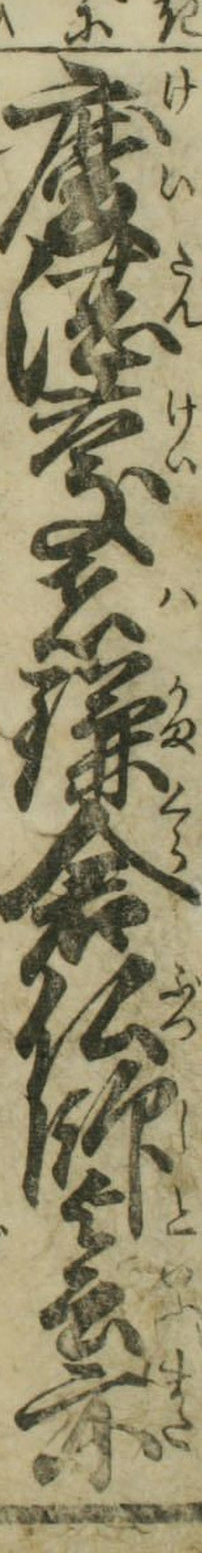慶湛慶者鎌倉仏師与云亦
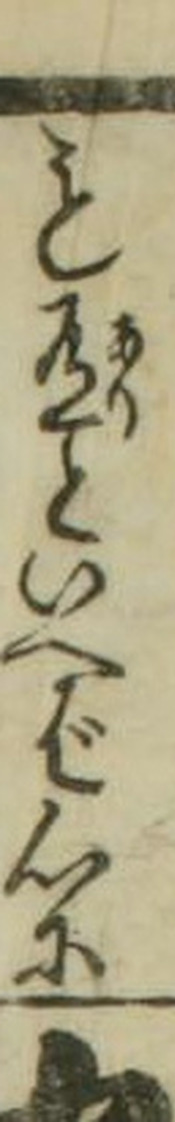こと有といへば心に
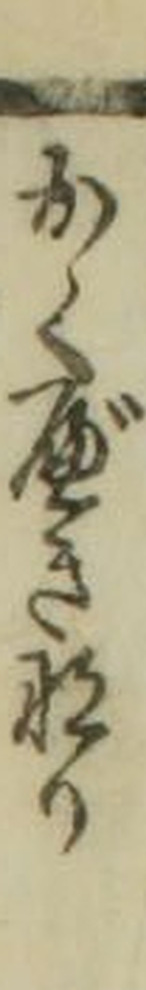かくべきなり
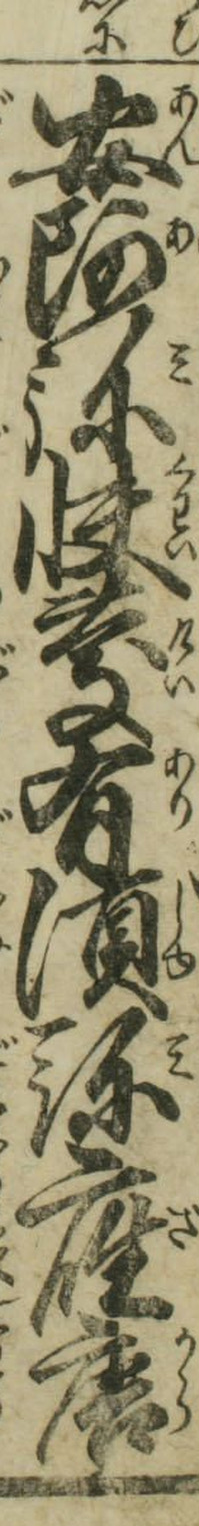安阿弥快慶有須弥座唐
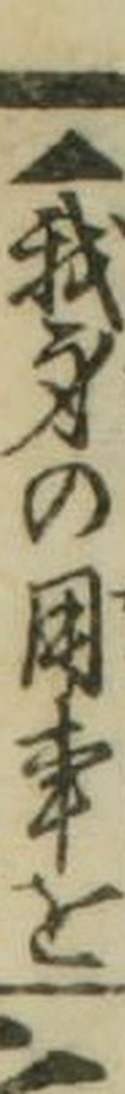▲我身の用事を
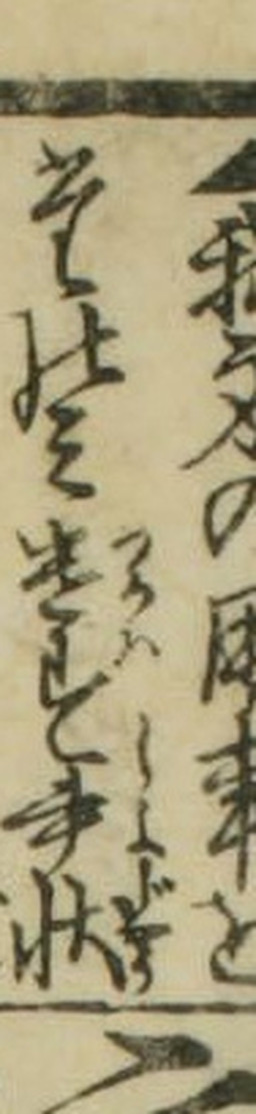たのみ遣す書状
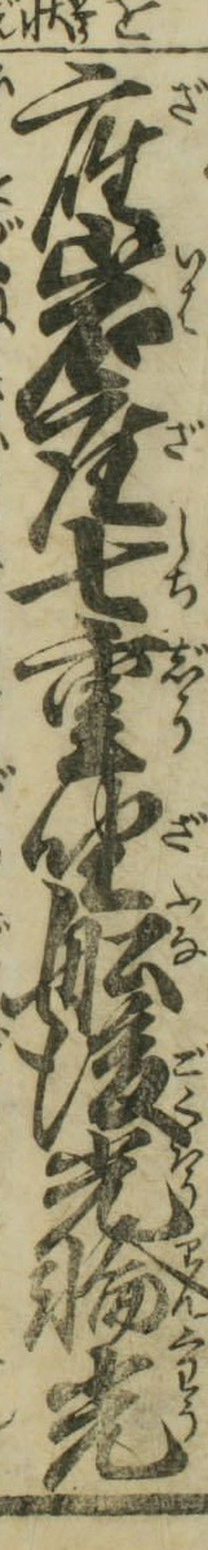座岩座七重座舩後光輪光
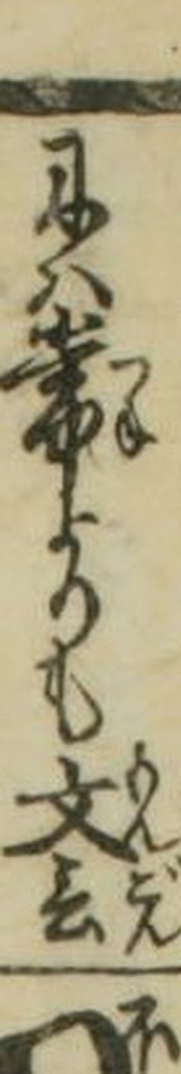には常よりも文言
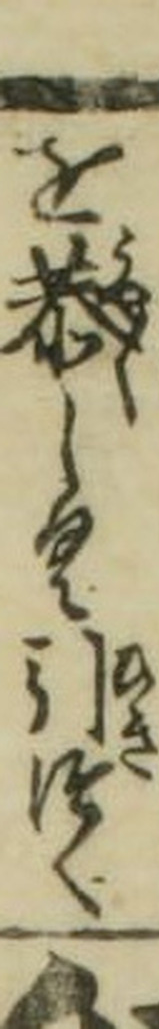を恭しく引つく
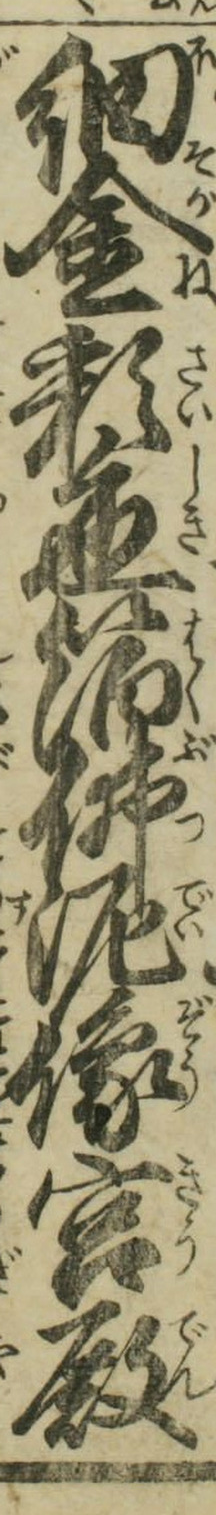細金彩色箔佛泥像宮殿
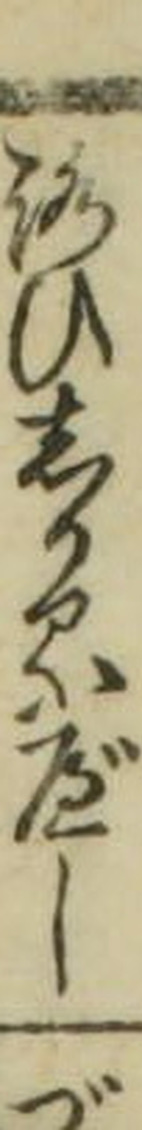ろひしかるべし
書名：増補職人往来
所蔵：東京学芸大学教育コンテンツアーカイブ
